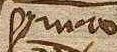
symão
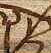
p̄yz
